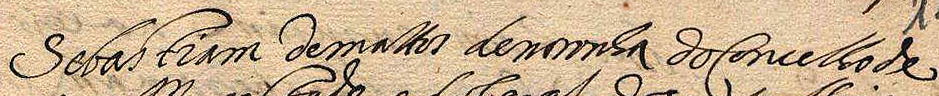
Sebastiam de mattos de noronha do Concelho de
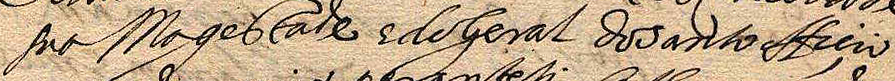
sua Magestade E do Geral do santo officio
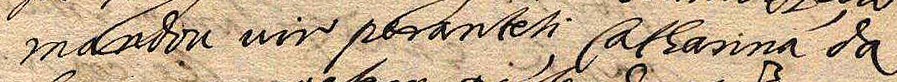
mandou uir perante si Catharina da
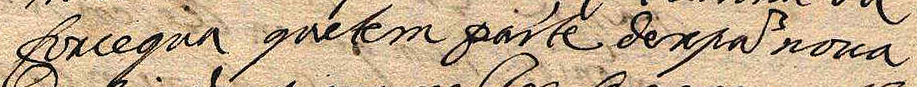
foncequa que tem parte de xpā noua
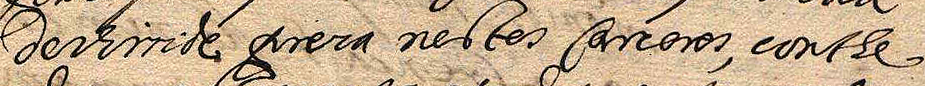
de virride preza nestes Carceres, conthe
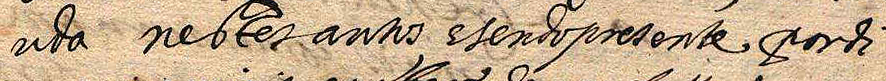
uda nestes autos E sendo presente por di
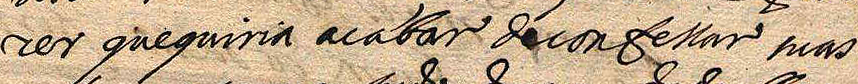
zer que quiria acabar de confessar suas
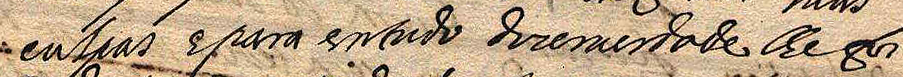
culpas E para en tudo dizer uerdade lhe foi
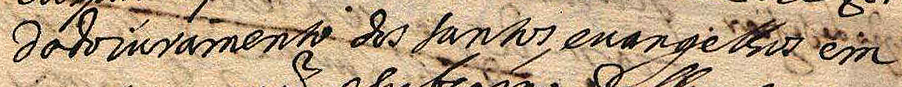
dado iuramento dos santos euangelhos em
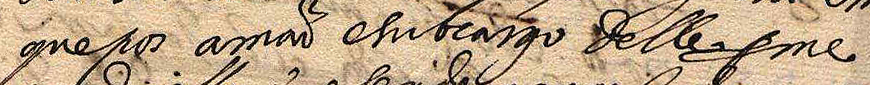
que pos a maõ e sub cargo delle ꝓme
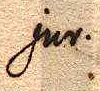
jur.
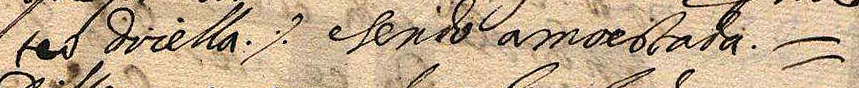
teo dizella. /. e sendo amoestada. =
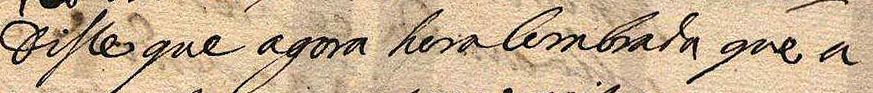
Disse que agora hera lembrada que a
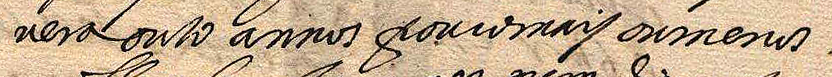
uera outo annos pouco mais ou menos
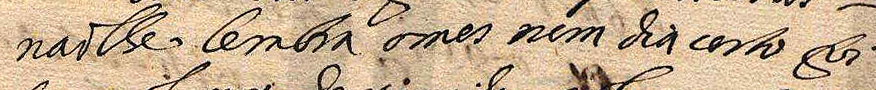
naõ lhe lembra o mes nem dia certo foi
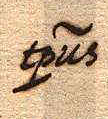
tpūs
